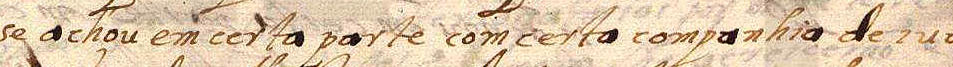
se achou em certa parte com certa companhia de sua
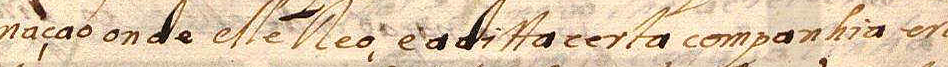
naçaõ onde elle Reo, e a ditta certa companhia en
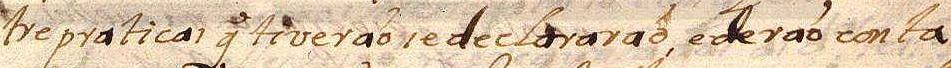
tre praticas q̄ tiveraõ se declararaõ, e deraõ conta
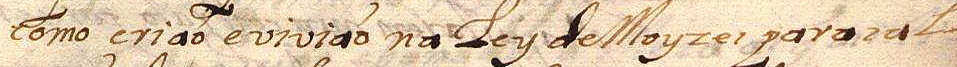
como criaõ e viviaõ na Ley de Moyzes para sal
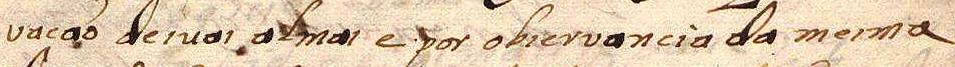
vaçaõ de suas almas e por observancia da mesma
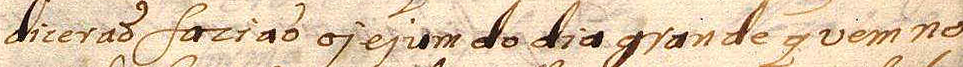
diceraõ faziaõ o jejum do dia grande q̄ vem no
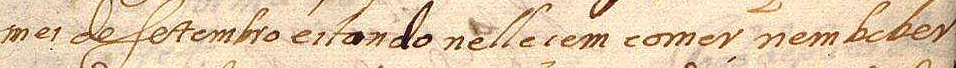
mes de setembro estando nelle sem comer nem beber
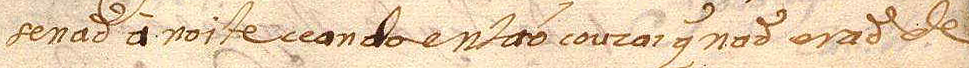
senaõ à noite ceando entaõ couzas q̄ naõ eraõ de
